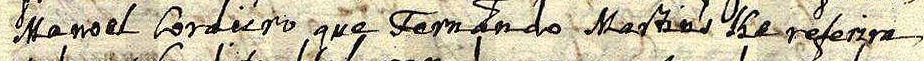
Manoel Cordeiro que Fernando Martins lhe referira
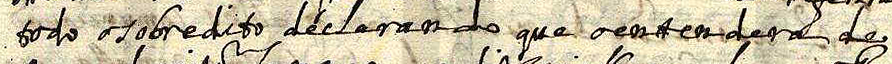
todo o sobredito declarando que o entendera de
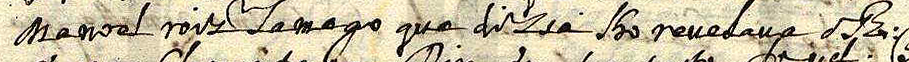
Manoel roiz̄ Lamego que dizia lho reuelaua o R.
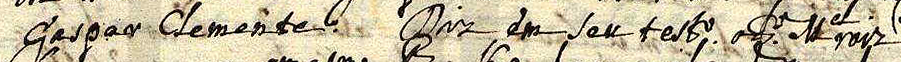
Gaspar Clemente. Diz em seu testo. o d̄.o Mel roiz̄
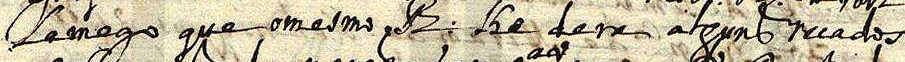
Lamego que o mesmo R: lhe dera alguns recados
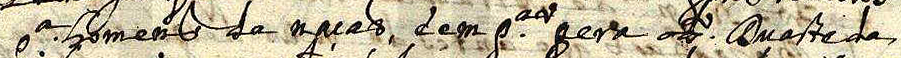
pa. homens da naçaõ, e em p.ar pera o d̄.o Duarte da
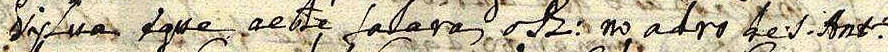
sylua e que a este falara, o R. no adro de .s. Ant.o
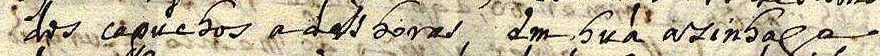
dos capuchos a des horas, em huā azinhaga
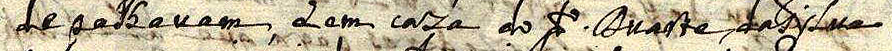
de palhauam, e em caza do d̄.o Duarte da sylua
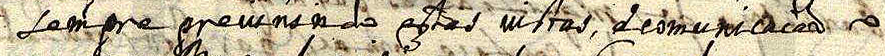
sempre preuinindo estas uistas, e comunicaçaõ o
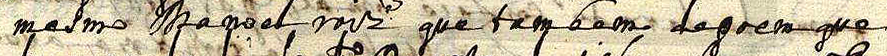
mesmo Manoel roiz̄ que tambem depoem que
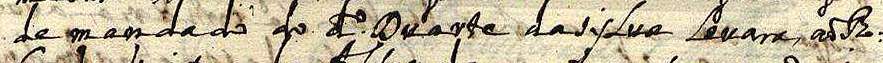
de mandado do d̄.o Duarte da sylua leuara ao R.
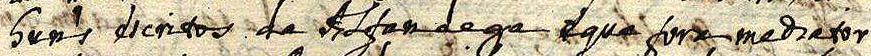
huns escritos da Alfandega e que fora mediator
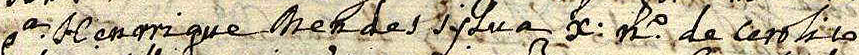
pa; Henrrique Mendes sylua x: n.o de cerolico
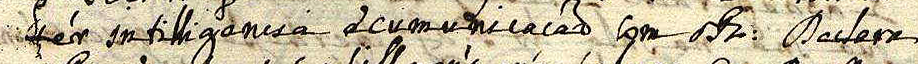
ter intilligencia e comunicaçaõ com o R: Declara
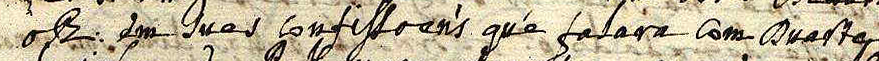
o R: em suas confissoen̄s que falara com Duarte
